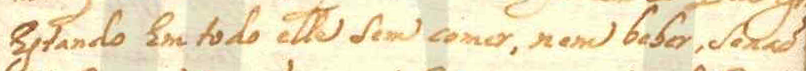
Estando Em todo elle sem comer, nem beber, senaõ
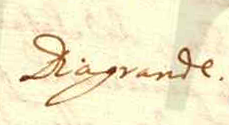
Dia grande.
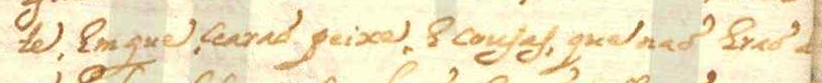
te, Em que Cearaõ peixe, E cousas, que naõ Eraõ d
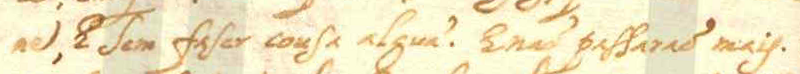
ne, E sam faser cousa alguā. E naõ passaraõ mais.
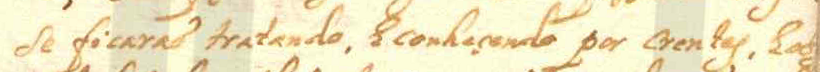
se ficaraõ tratando, E conhecendo por crentes, E ob
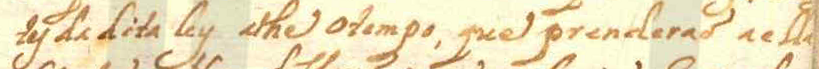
tes da dita ley athe o tempo, que prenderaõ a ella
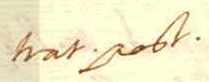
trat post.
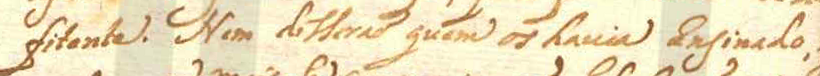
fitente. Nem disseraõ quem os hauia Ensinado,
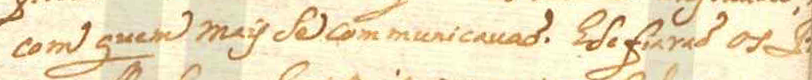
com quem mais se communicauaõ. E se fiaraõ os
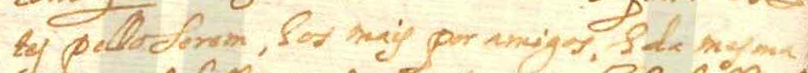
tas pello serem, E os mais por amigos, E da mesma
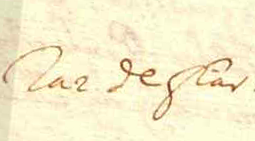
Raz de fiar.
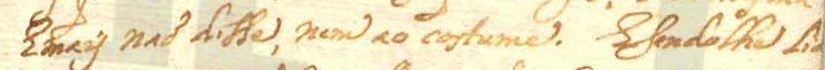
E mais naõ disse, nem ao costume. E sendolhe li
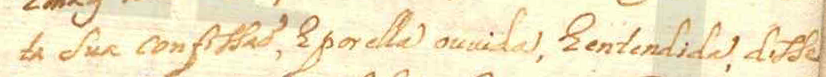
ta sua confissaõ, E por ella ouuida, E entendida, disse
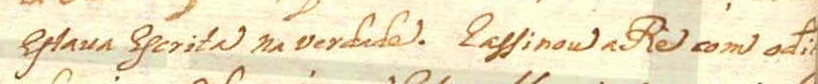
Estaua Escrita na verdade. E assinou a Re com o di
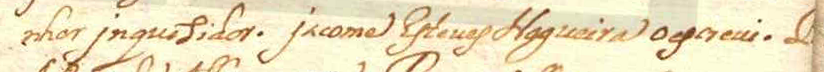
nhor jnquisidor. jacome Esteues Nogueira o escreui.
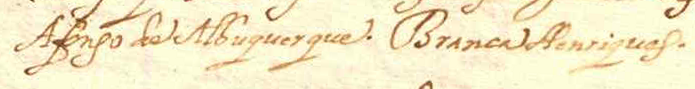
Afonso de Albuquerque. Branca Henriques.
